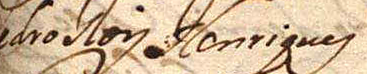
Pedro Rois Henriques
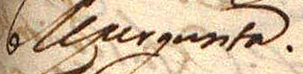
Repergunta.
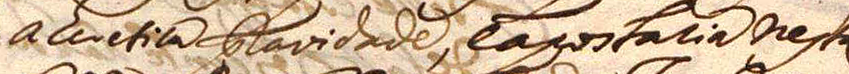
a heretica pravidade, e apostazia nesta
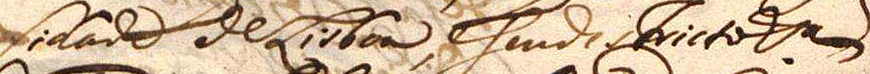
Cidade de Lisboa, e seu destricto &.a
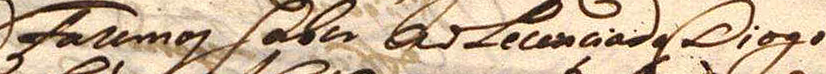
Fazemos saber ao Lecençiado Diogo
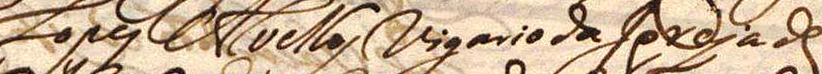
Lopes Alvellos Vigario da Jgreja de
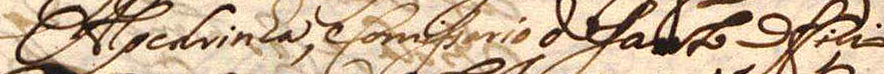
Alpedrinha, e Comissario do santo offiçio
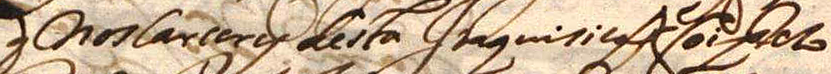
q nos Carceres desta Jnquisicaõ foi prezo
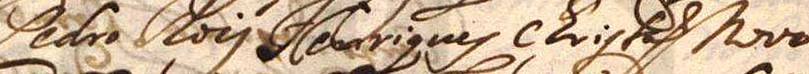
Pedro Rois̄ Henriques christaõ novo
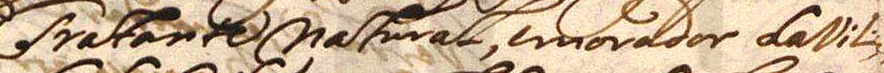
Tratante natural, e morador da Vil
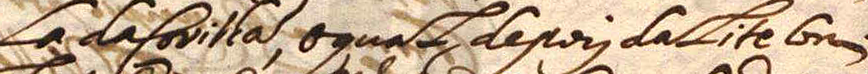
La da Covilhã, o quaL depois da Lite Con
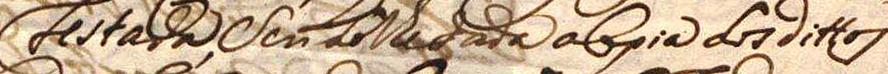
testada, sendolhe dada a Copia dos dittos
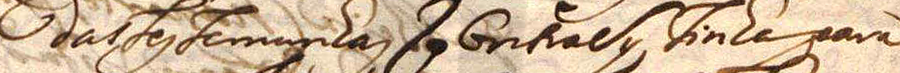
das testemunhas, q̄ Contra sy tinha para
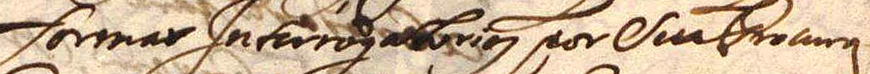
formar Jnterrogatorios por seu Procura
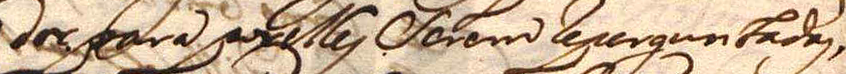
dor para por elles serem Reperguntadas,
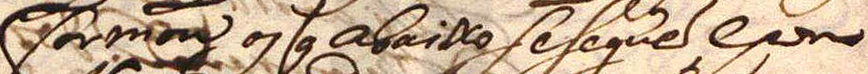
formou os q̄ abaixo se seguē e por
